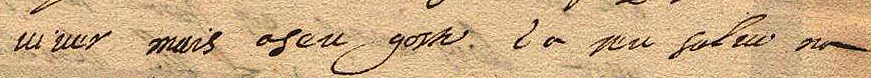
uiuer mais a seu gosto e a seu saluo na
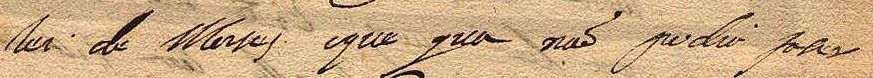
lei de Moises o que qua não podia faser
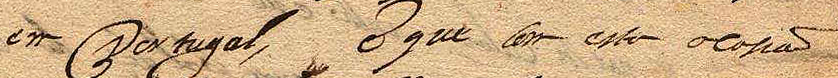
em Portugal, e que com esta ocasiaõ
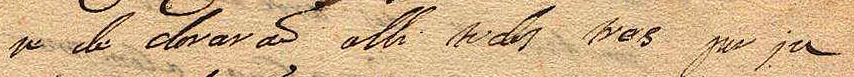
se declararão alli todos tres por ju
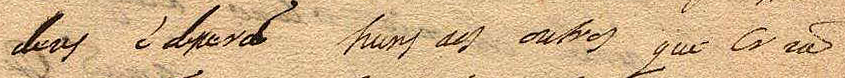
deus e disserão huns aos outros que crião
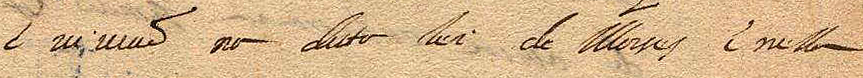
e uiuiaõ na ditta lei de Moises e nella
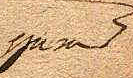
spera
